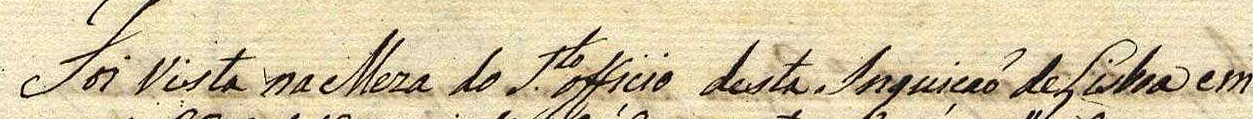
Foi vista na Meza do S.to officio desta Inquiçaõ de Lisboa em
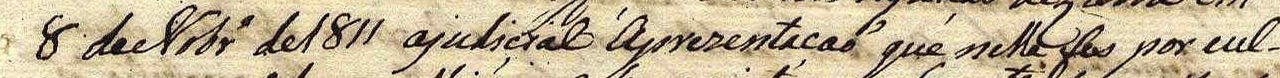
8 de Nobr.o de 1811 a judicial Aprezentaçaõ que nella fes por cul
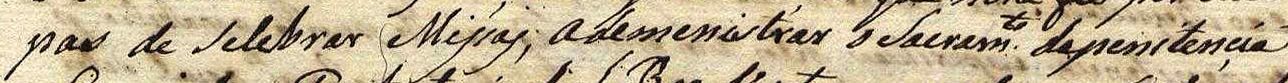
pas de selebrar Missas, adeministrar o Sacram.to da penitencia
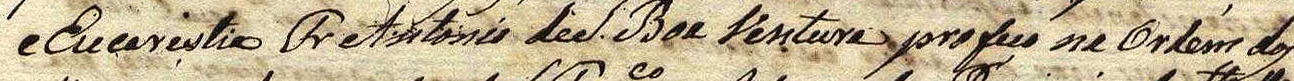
e Eucaristia Fr Antonio de S. BoaVentura profeço na Ordem dos
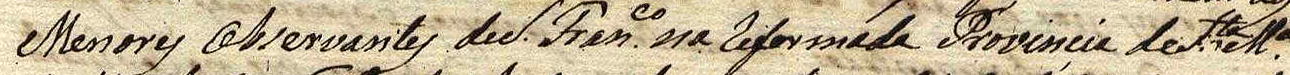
Menores Observantes de S. Fran.co na Reformada Provincia de S.ta M.a
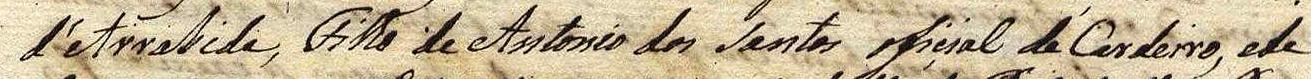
d'Arrabida, Filho de Antonio dos Santos official de Cardeiro, e de
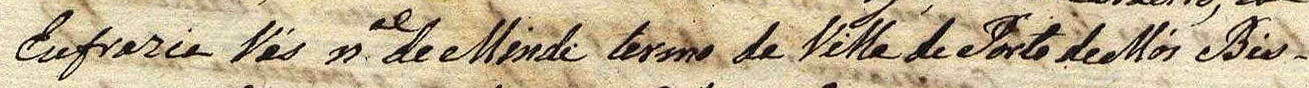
Eufrazia Vás n.al de Minde termo da Villa de Porto de Mós Bis
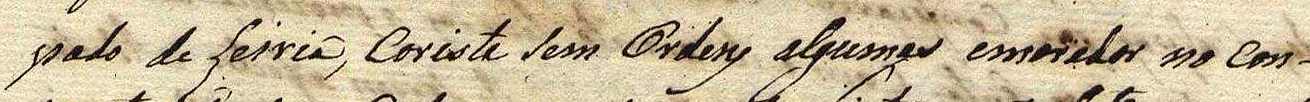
pado de Leiria, Corista sem Ordens algumas e morador no con
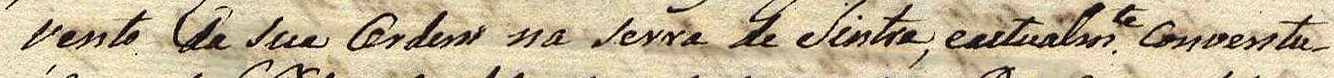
vento da sua Ordens na serra de Sintra, e actualm.te conventu
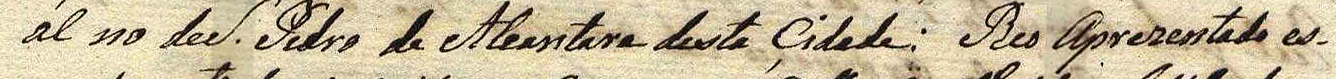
al no de S. Pedro de Alcantara desta Cidade: Reo Aprezentado es
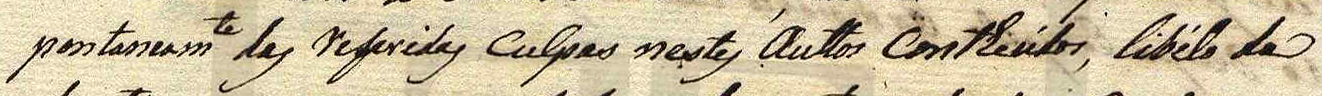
pontaneam.te das Referidas culpas nestes Autos contheudos, libélo da
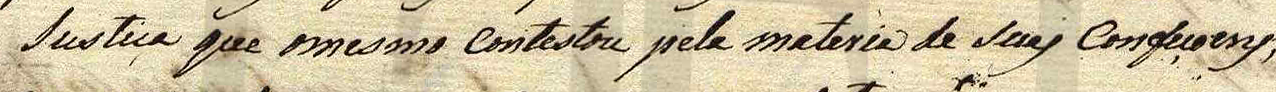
Iustiça que o mesmo contestou pela materia de suas confeçoens,
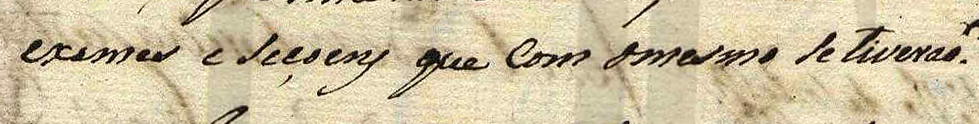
exames e seçoens que com o mesmo se tiveraõ.
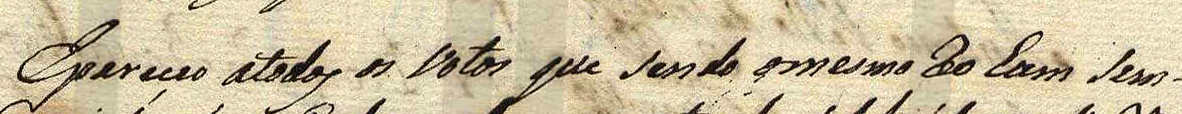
E pareceo a todos os votos que sendo o mesmo Reo hum sem
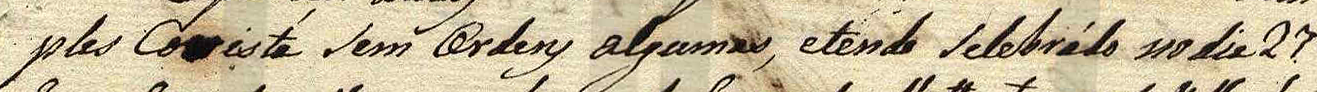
ples Co_ista sem Ordens algumas, e tendo selebrado no dia 27
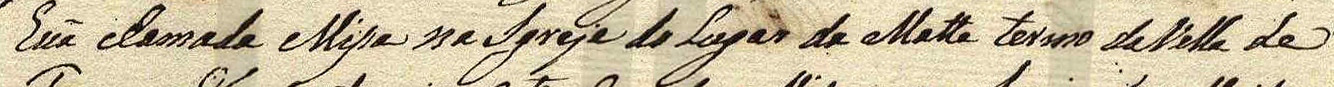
huā chamada Missa na Igreja do Lugar da Matta termo da Villa de
